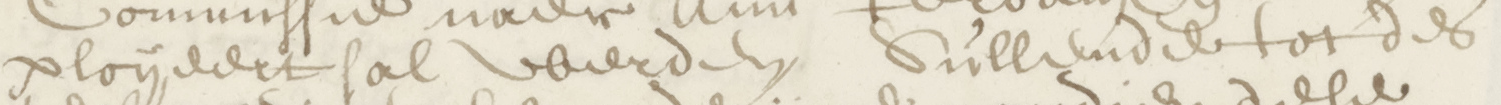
ploijeert sal werden. Sullende tot des
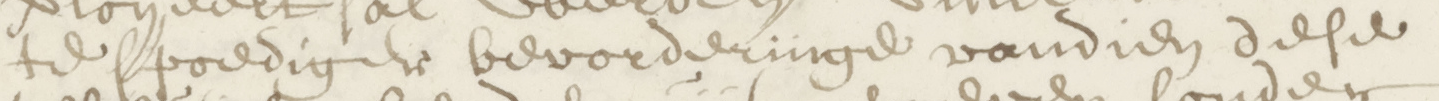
te spoediger bevorderinge vandien dese
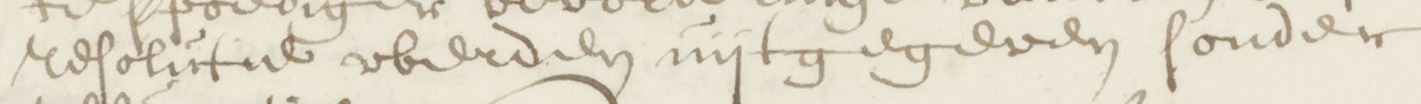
resolutie werden uijtgegeven sonder
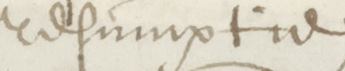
resumptie.
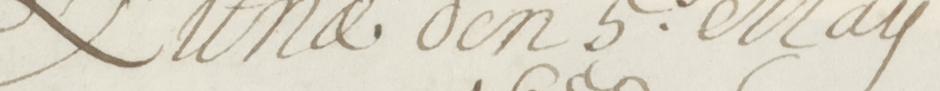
Lunæ den 5e. Maij
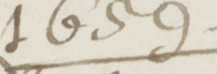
1659.
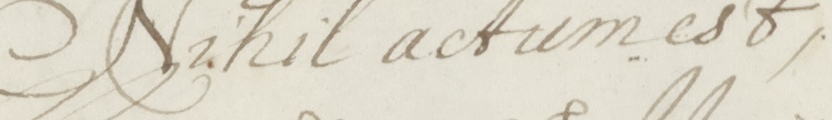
Nihil actum est.
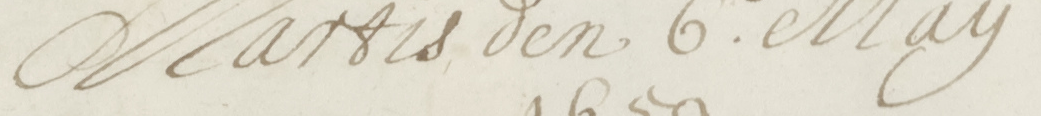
Martis den 6e Maij
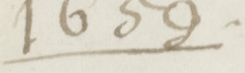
1659.
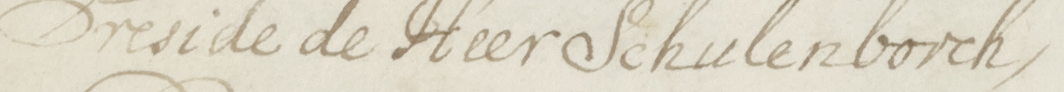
Preside de Heer Schulenborch,
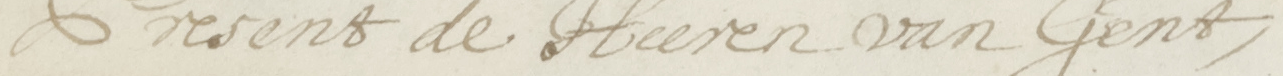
Present de Heeren van Gent,
